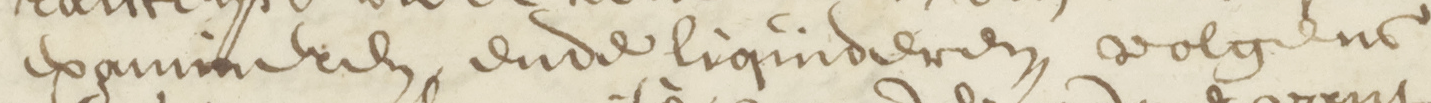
examineren, ende liquideren, volgens
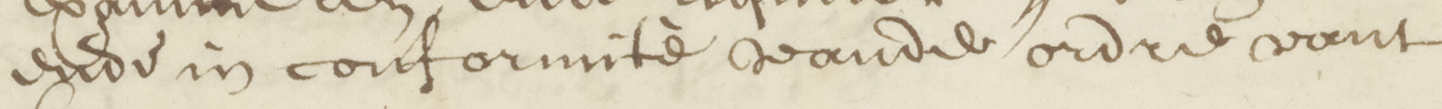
ende in conformitè vande ordre vant
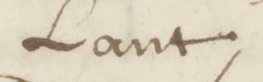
Lant.
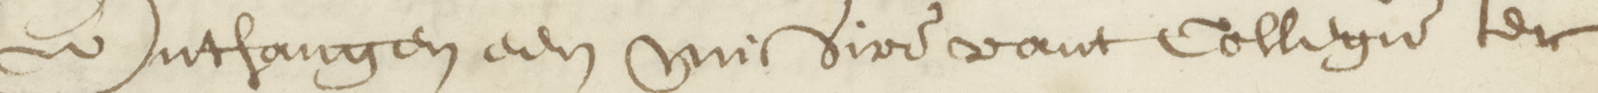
Ontfangen een missive vant Collegie ter
